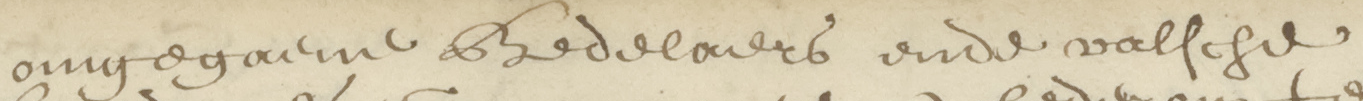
omgegaene Bedelaers ende valsche
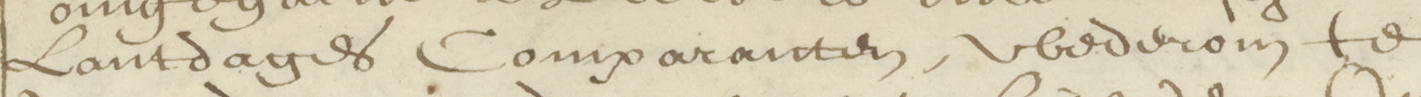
Lantdages Comparanten, wederom te
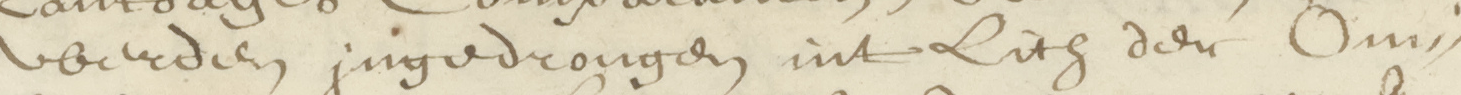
werden ingedrongen int Lith der Om„
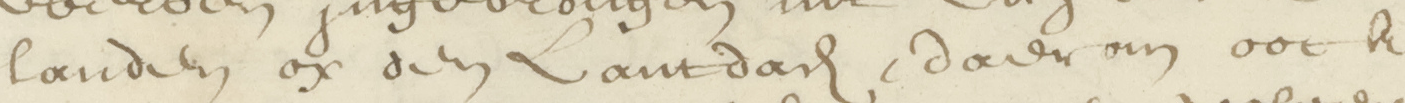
landen op den Lantdach, daerom oock
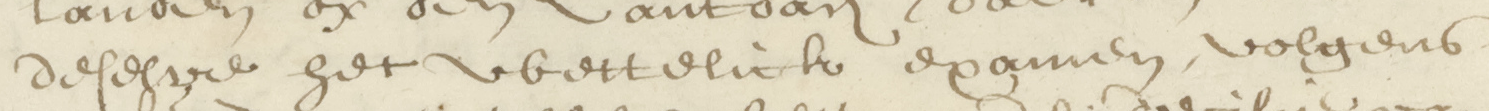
deselve het wettelick examen, volgens
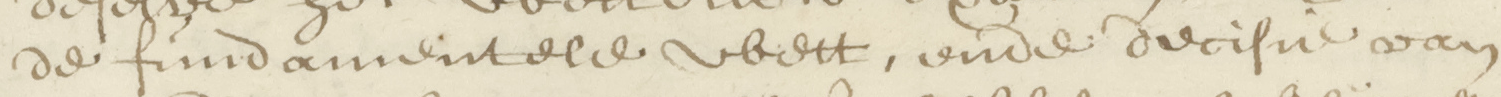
de fundamentele wett, ende decisie van
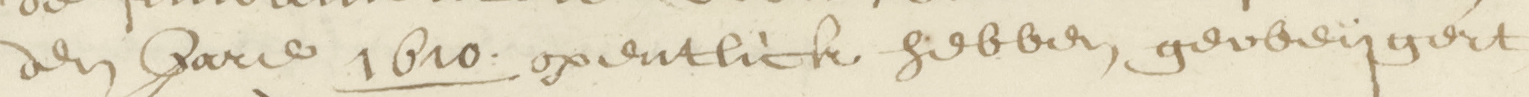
den Jare 1610. opentlick hebben geweijgert,
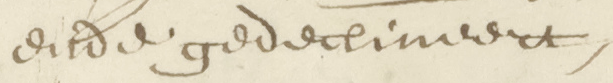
ende gedeclineert.
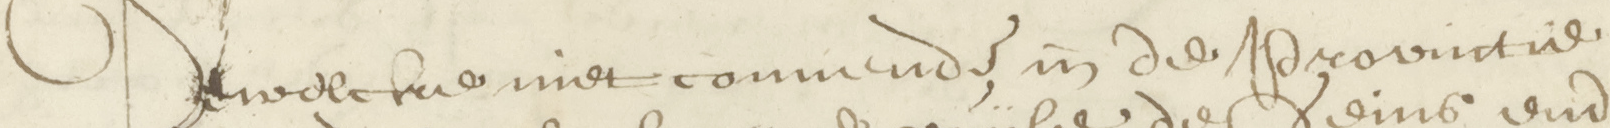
Dewelcke niet connende, in de Provintie
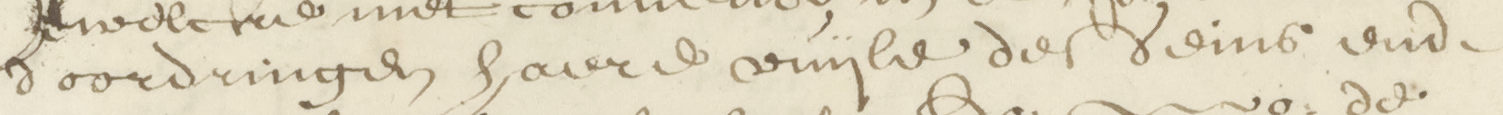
doordringen haere vuijle desseins ende
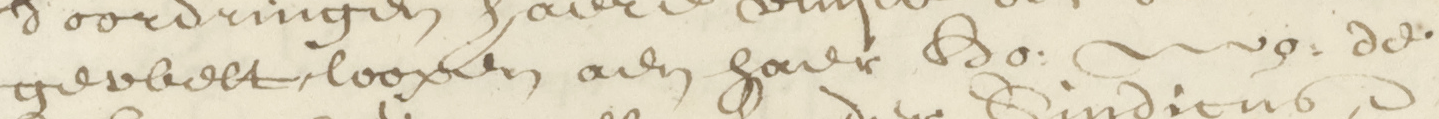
gewelt, loopen aen haer Ho:Mo: de
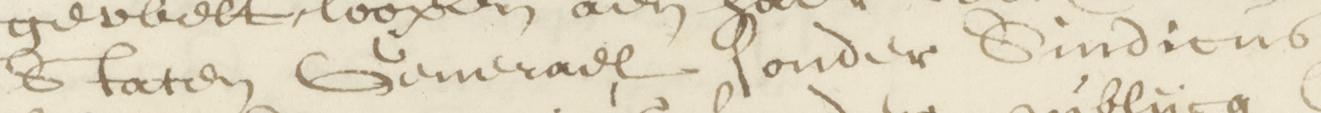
Staten Generael sonder Sindicus
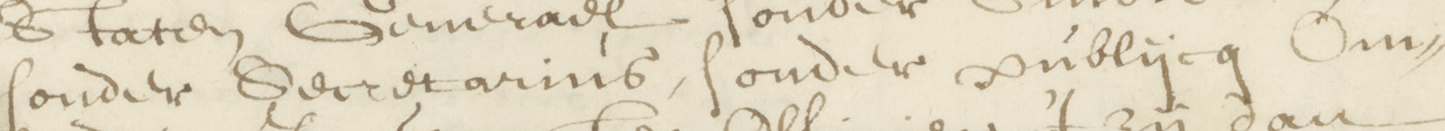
sonder Secretarius, sonder publijcq Om,,
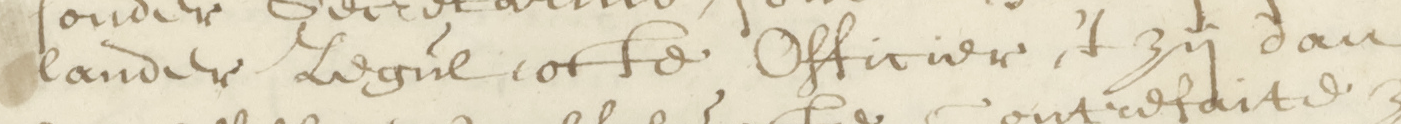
Lander Zegul, ofte Officier, 't zij dan
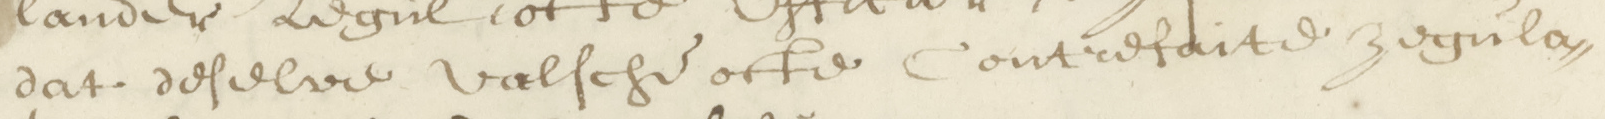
dat deselve valsche ofte Contrefaite zegula„
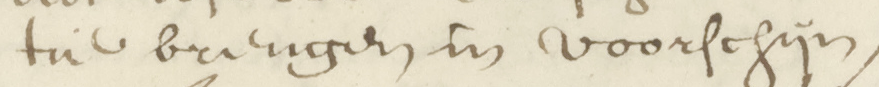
tie brengen in voorschijn.
